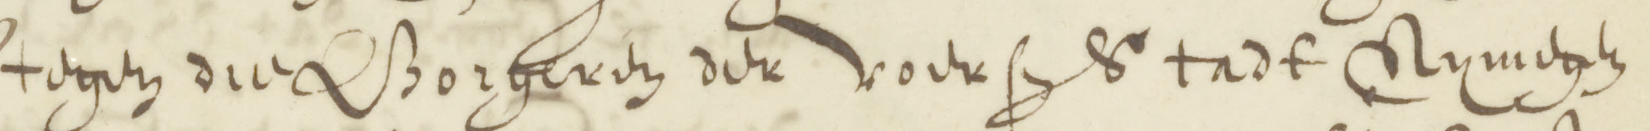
tegen die Borgeren der voers Stadt Nymegen
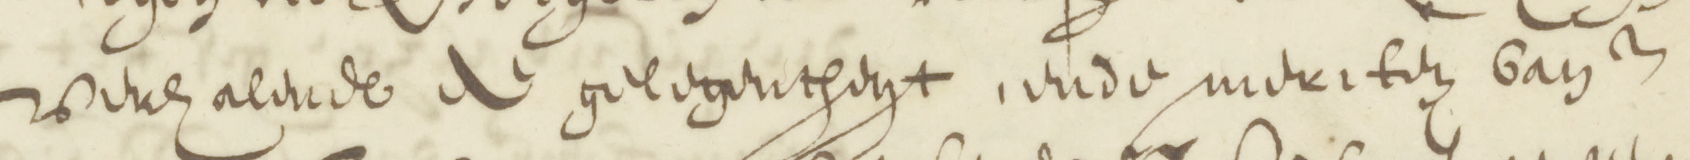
verhalende de gelegentheyt, ende meriten van
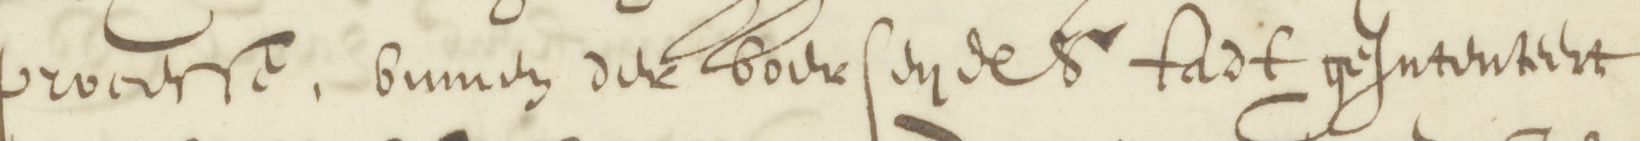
processe, binnen der voerseyde Stadt geIntenteert
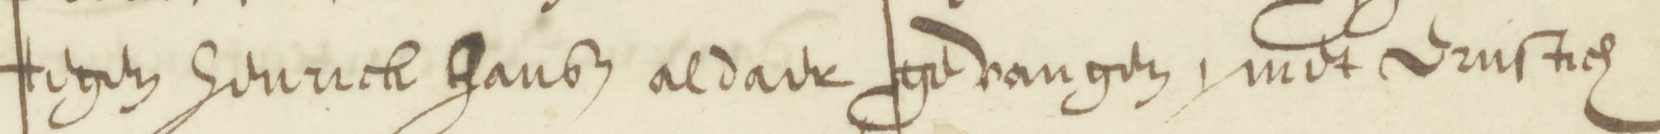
tegen henrick hansz aldaer gevangen met ernstich
